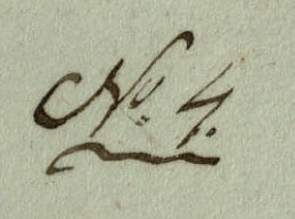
Nº 4.
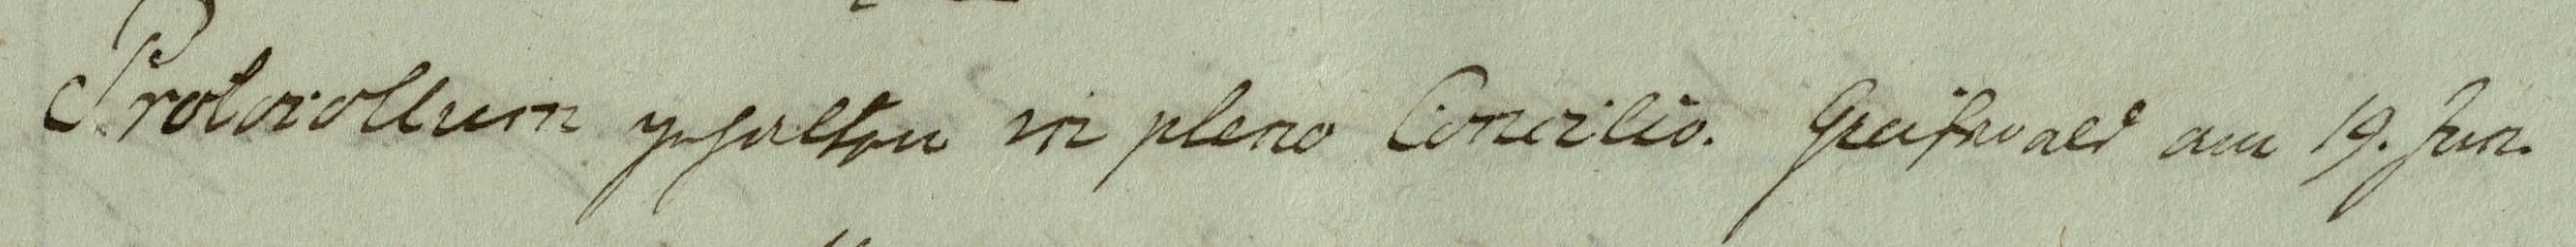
Protocollum gehalten in pleno Concilio. Greifswald am 19. Jun.
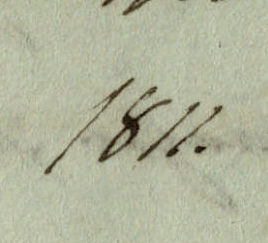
1811.
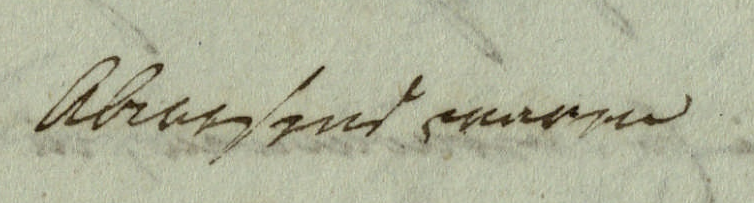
Abwesend waren
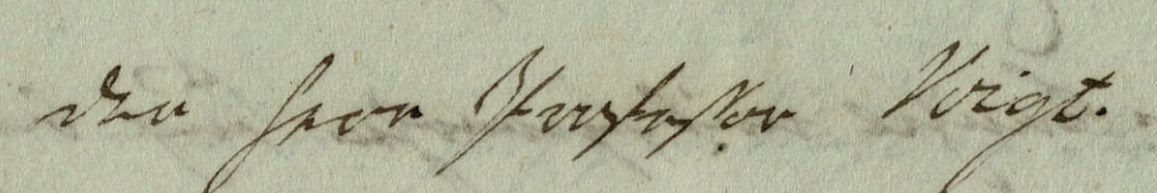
der herr Professor Voigt.
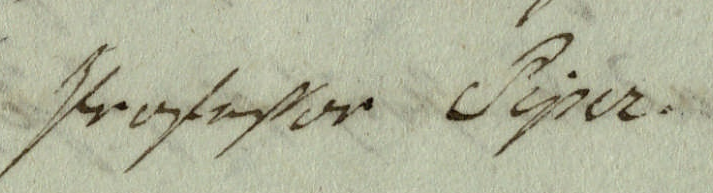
Professor Piper.
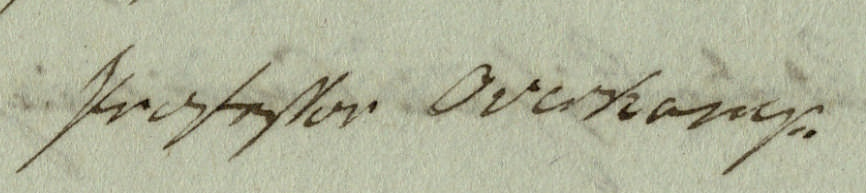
Professor Overkamp.
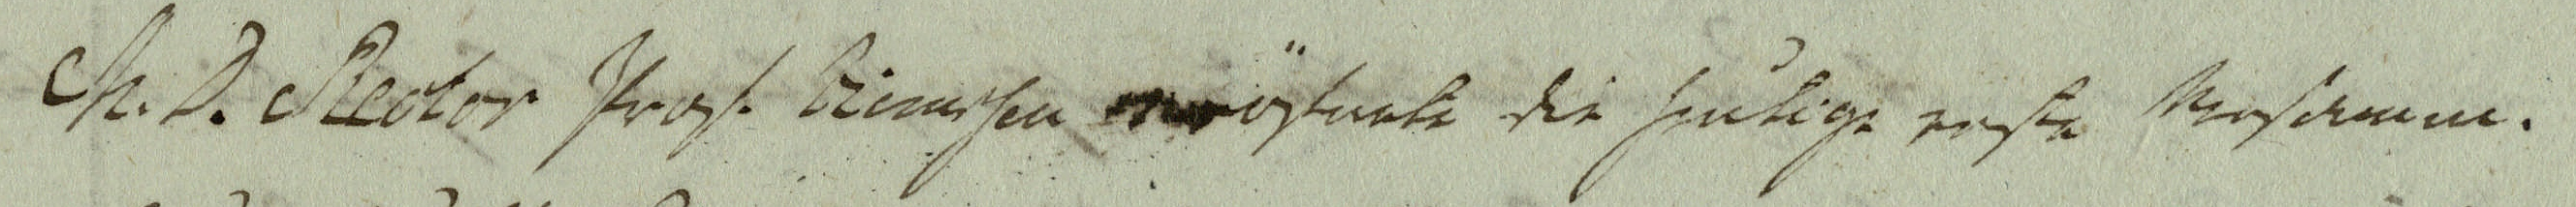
M. D. Rector Prof. Ziemssen eröffnete die heutige erste Versamm¬
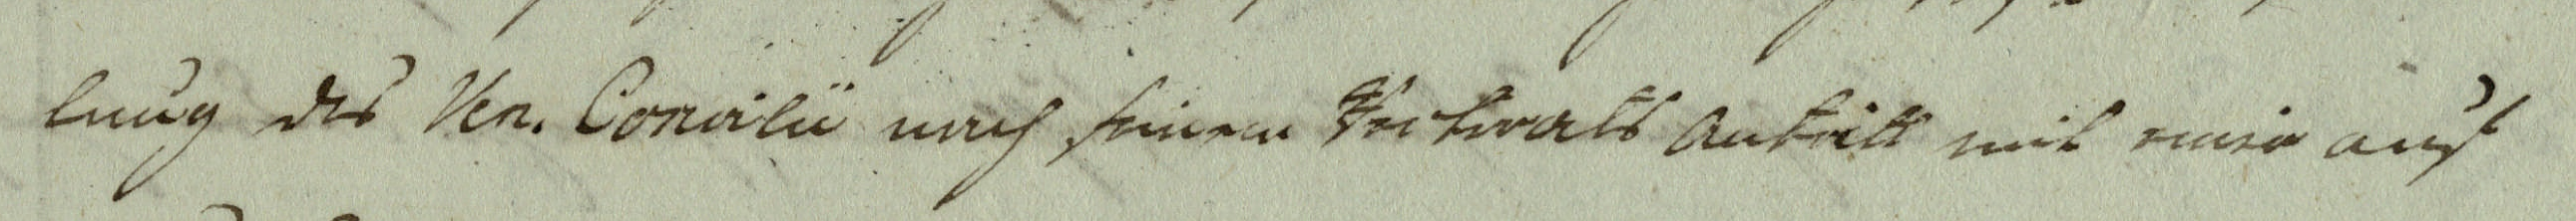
lung des Ven. Concilii nach seinem Rectorats Antritt mit einer auf
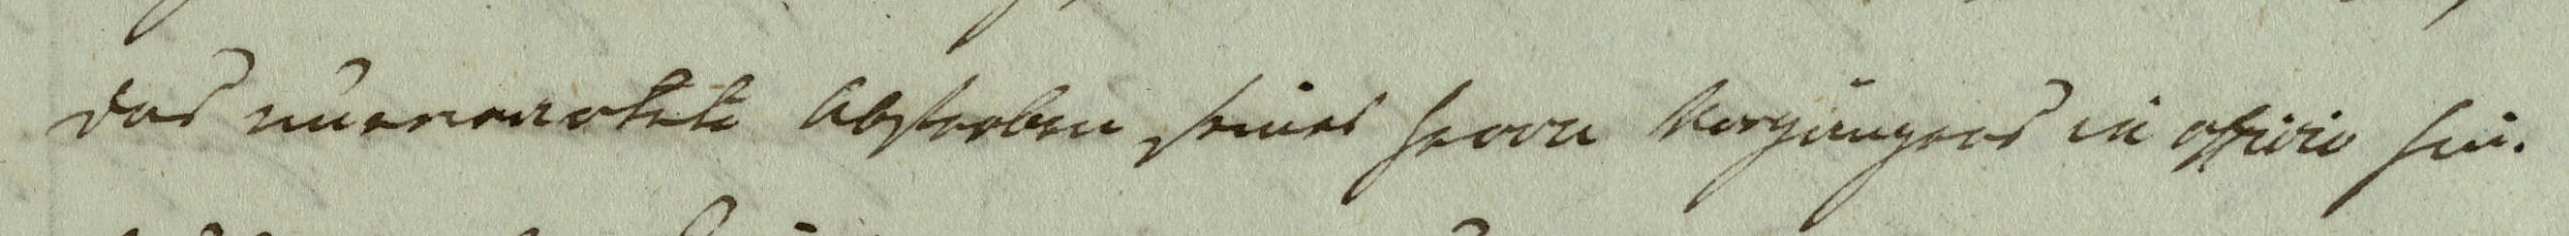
das unerwartete Absterben seines herrn Vorgängers in officio hin¬
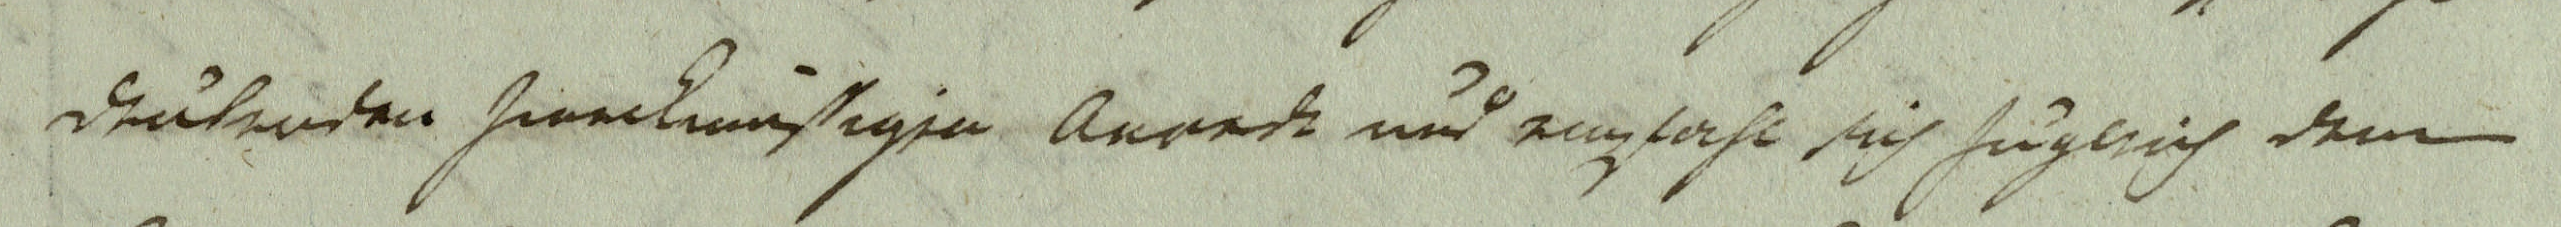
deutenden zweckmässigen Anrede und empfahl sich zugleich dem
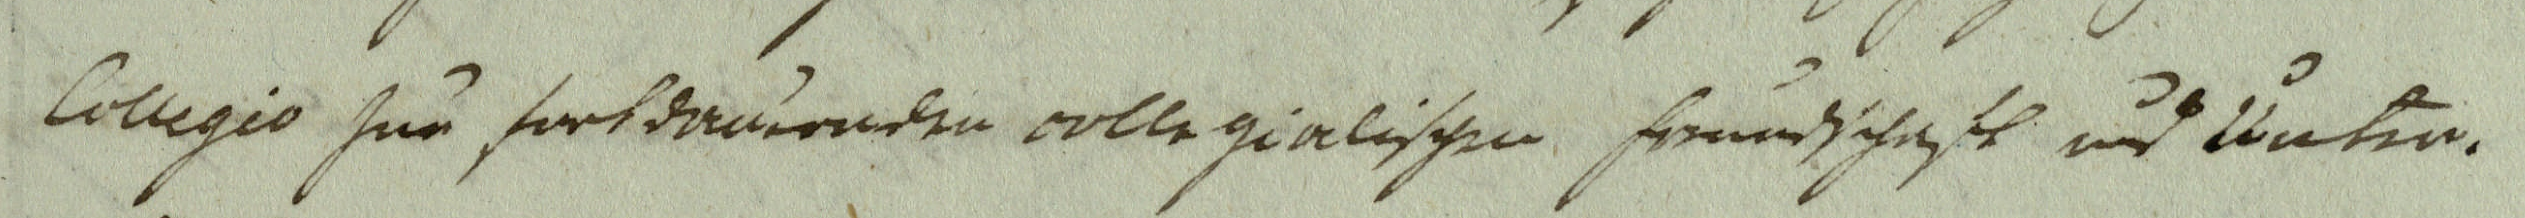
Collegio zur fortdauernden collegialischen Freundschaft und Unter¬
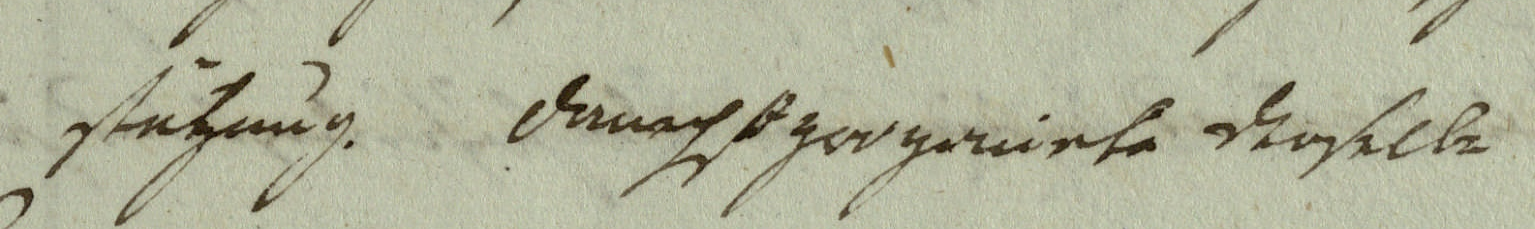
stützung. Danechst proponirte derselbe
